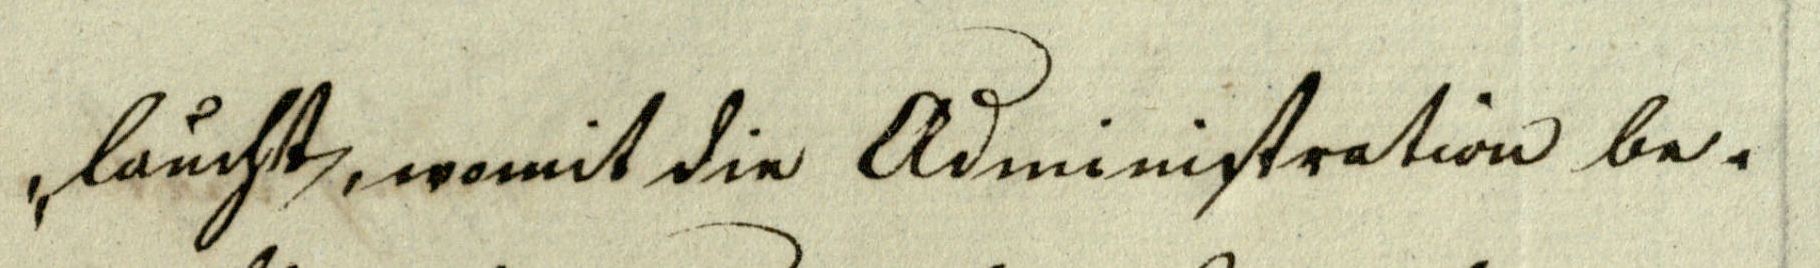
"laucht, womit die Administration be¬
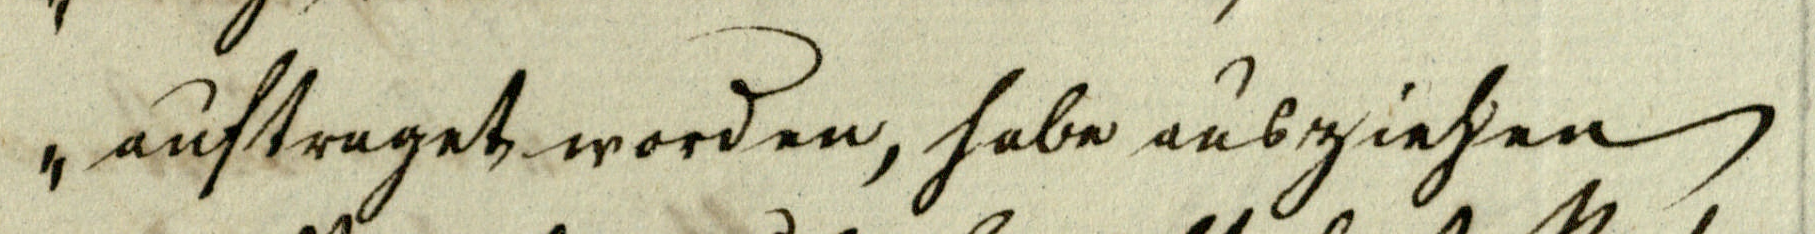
"auftraget worden, habe ausziehen
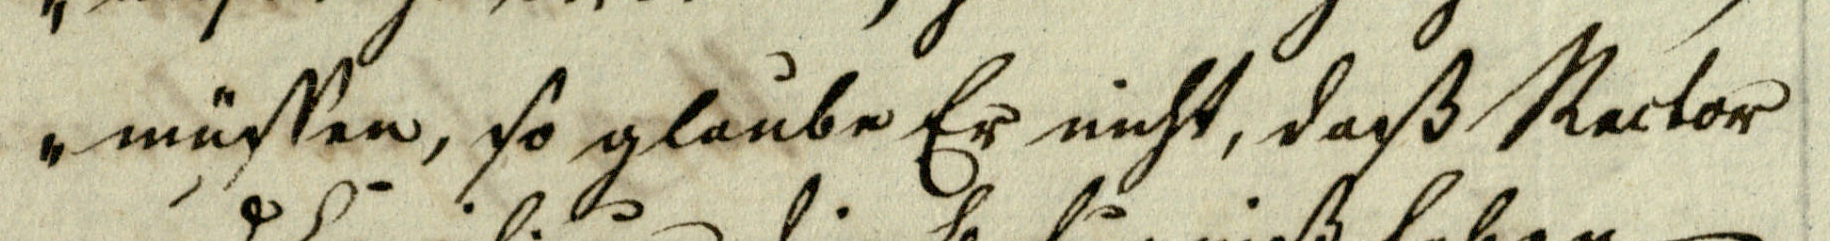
"müssen, so glaube Er nicht, daß Rector
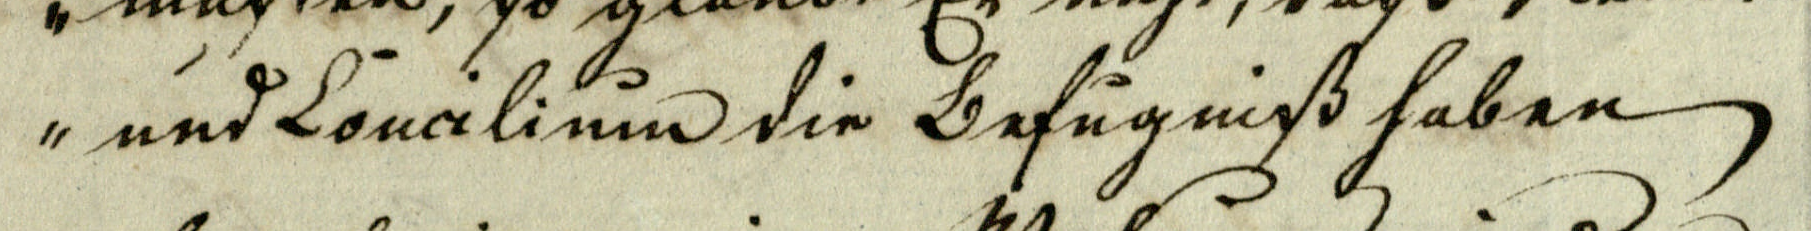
"und Concilium die Befugniß haben
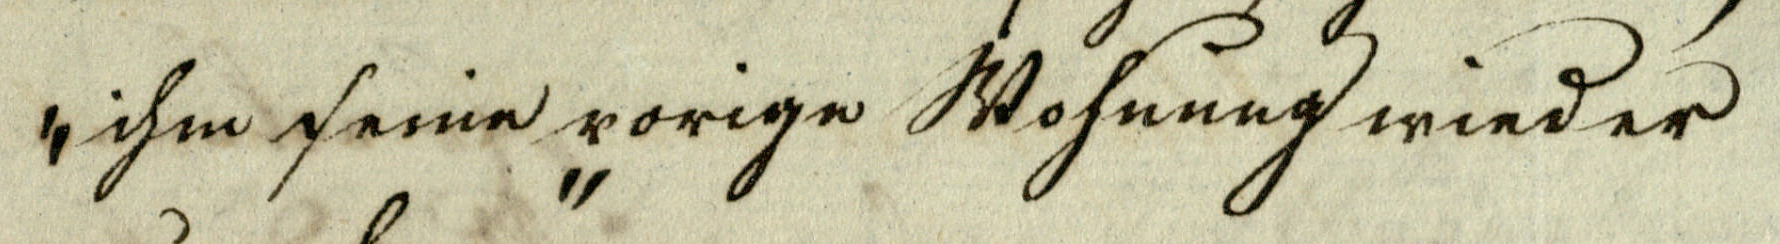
"ihm seine vorige Wohnung wieder
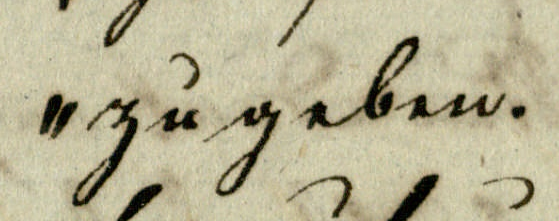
"zu geben."
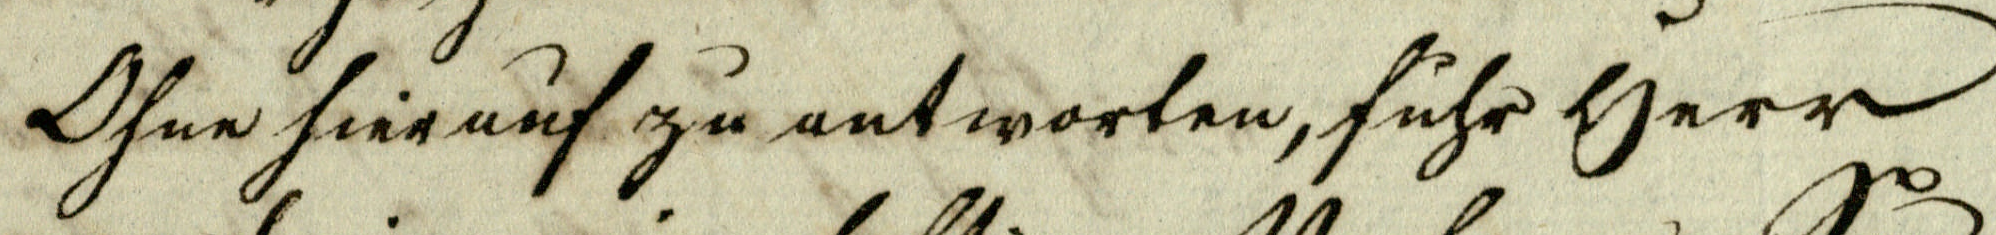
Ohne hierauf zu antworten, fuhr Herr
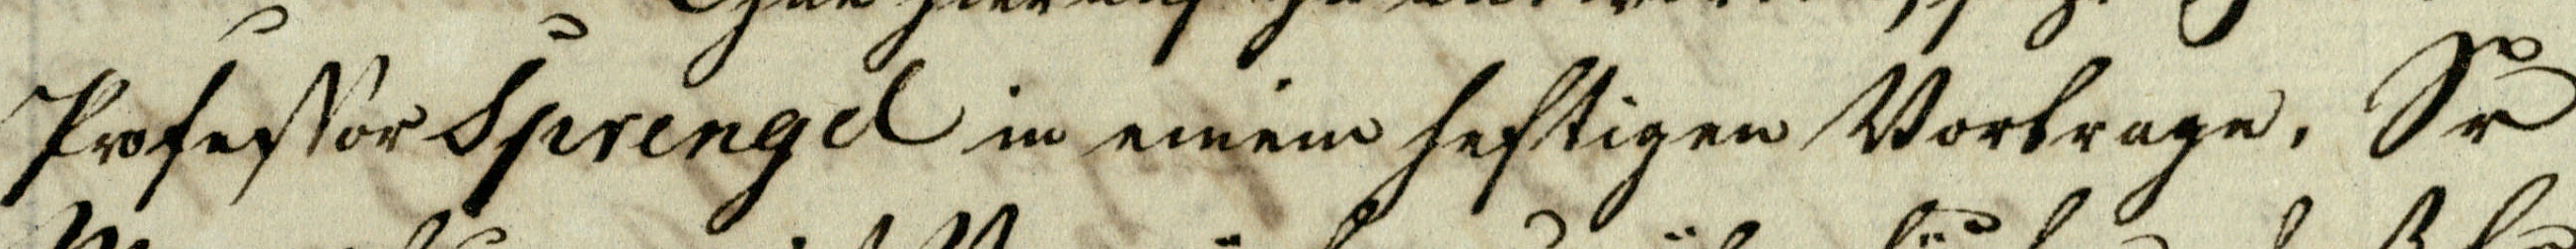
Professor Sprengel in einem heftigen Vortrage, Sr
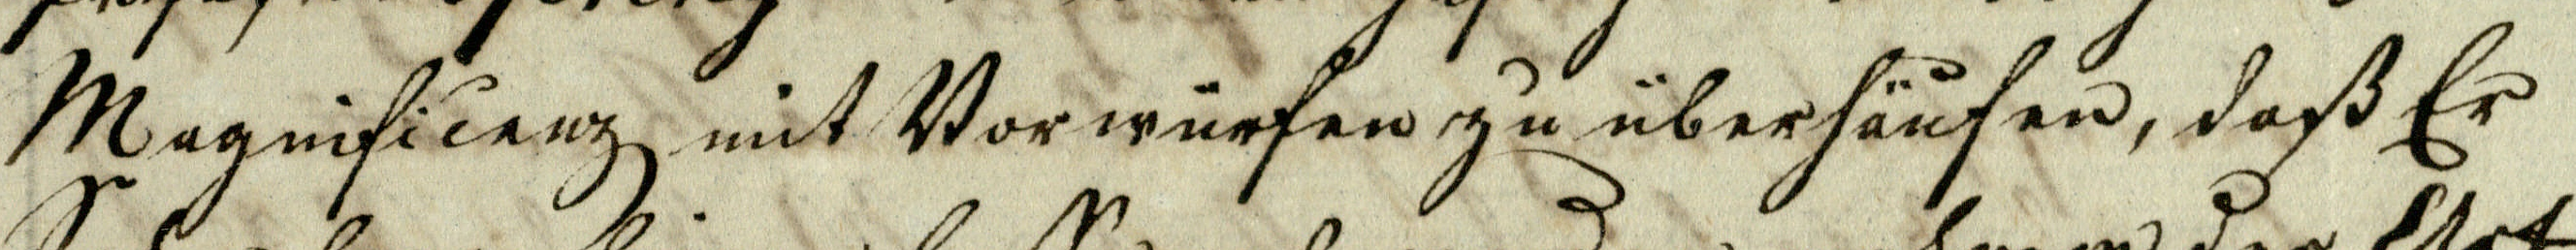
Magnificenz mit Vorwürfen zu überhäufen, daß Er
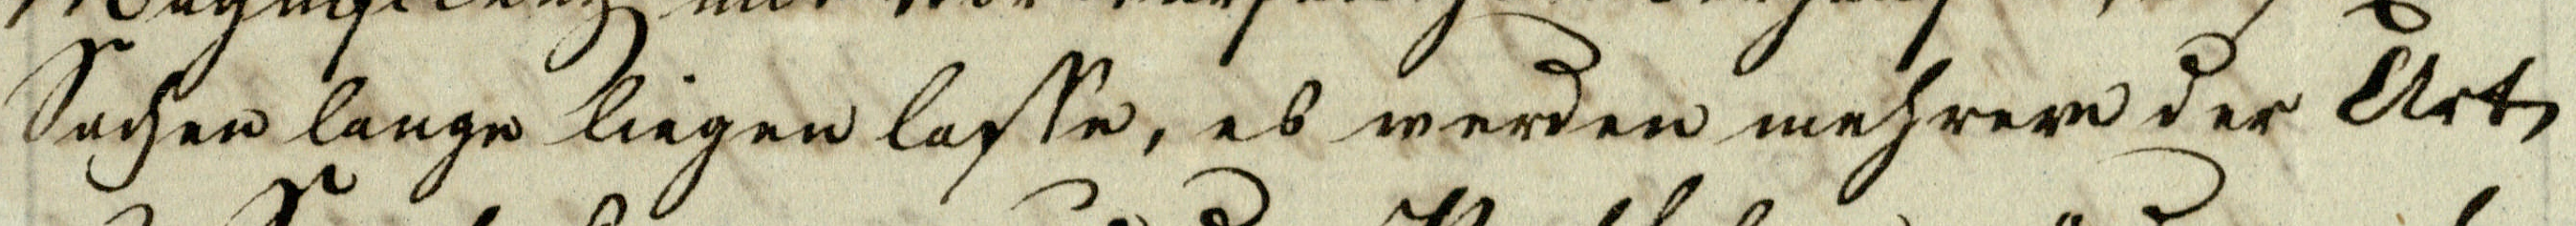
Sachen lange liegen lasse, es werden mehrere der Art
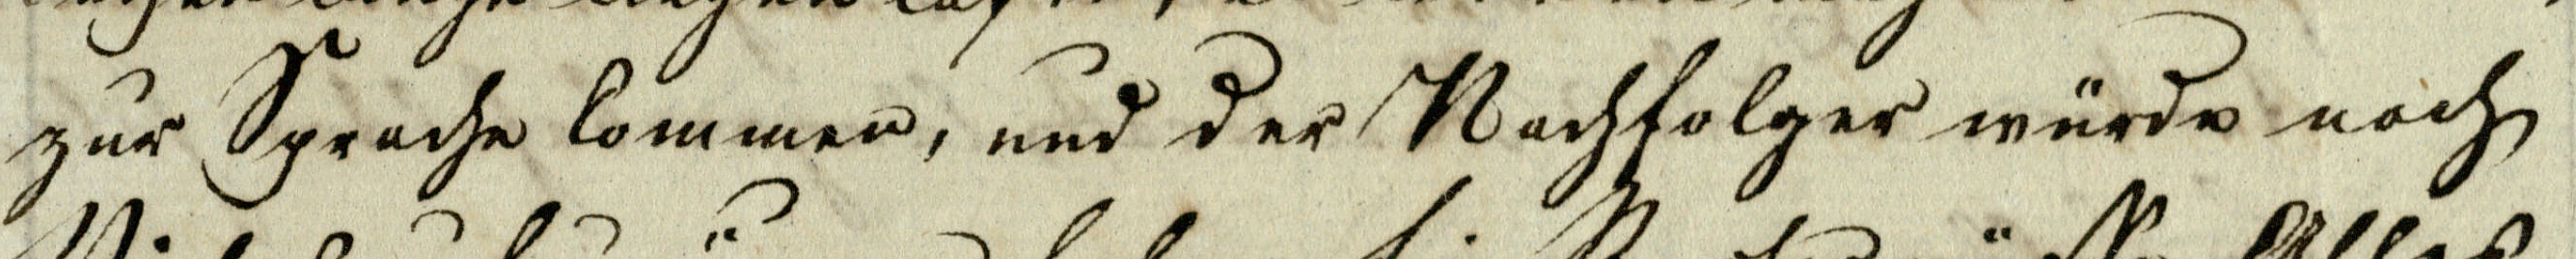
zur Sprache kommen, und der Nachfolger würde noch
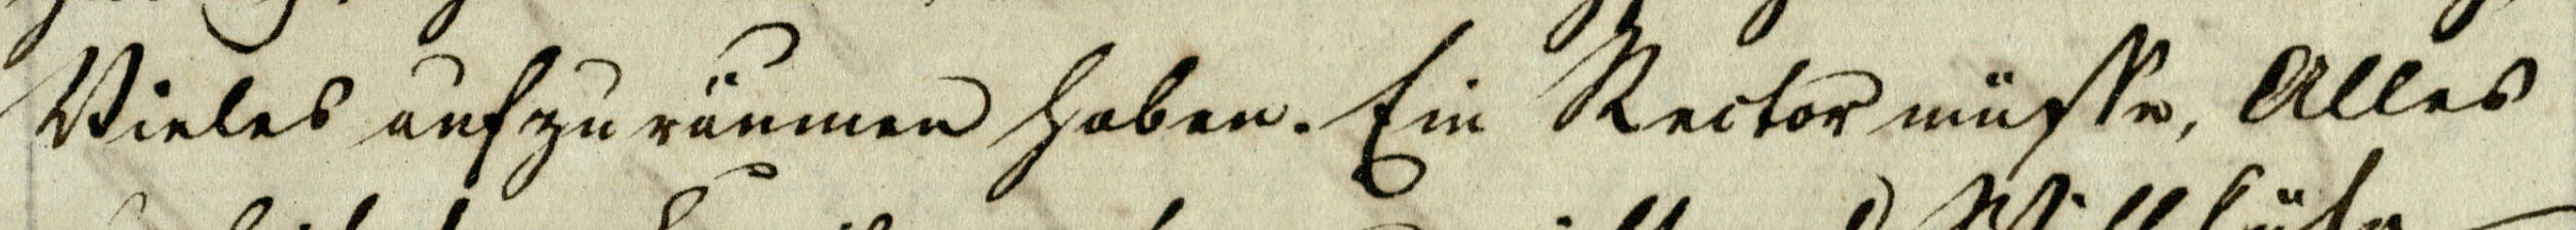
Vieles aufzuräumen haben. Ein Rector müsse, Alles
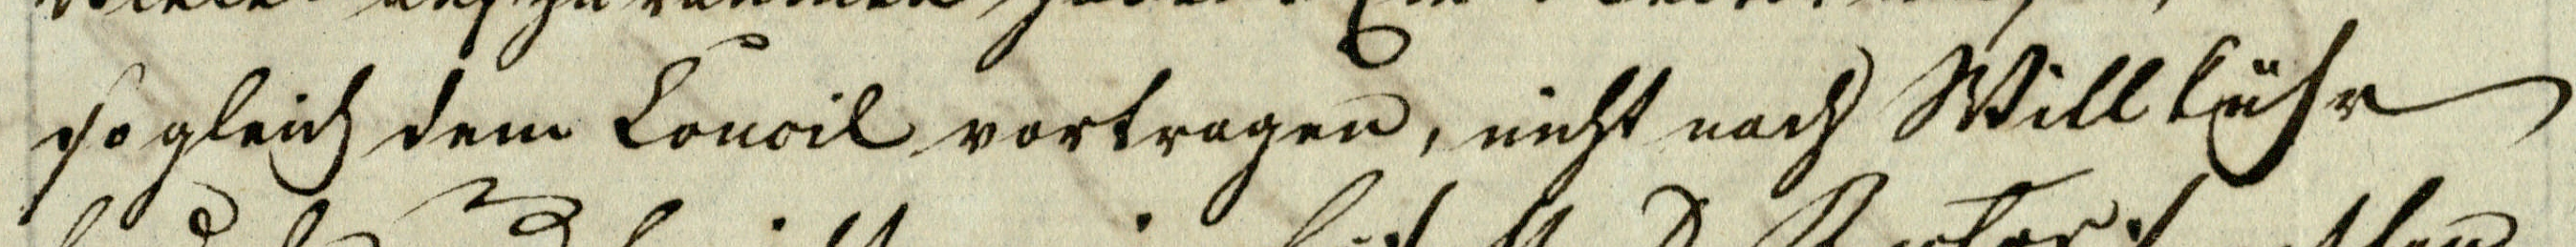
so gleich dem Concil vortragen, nicht nach Willkühr
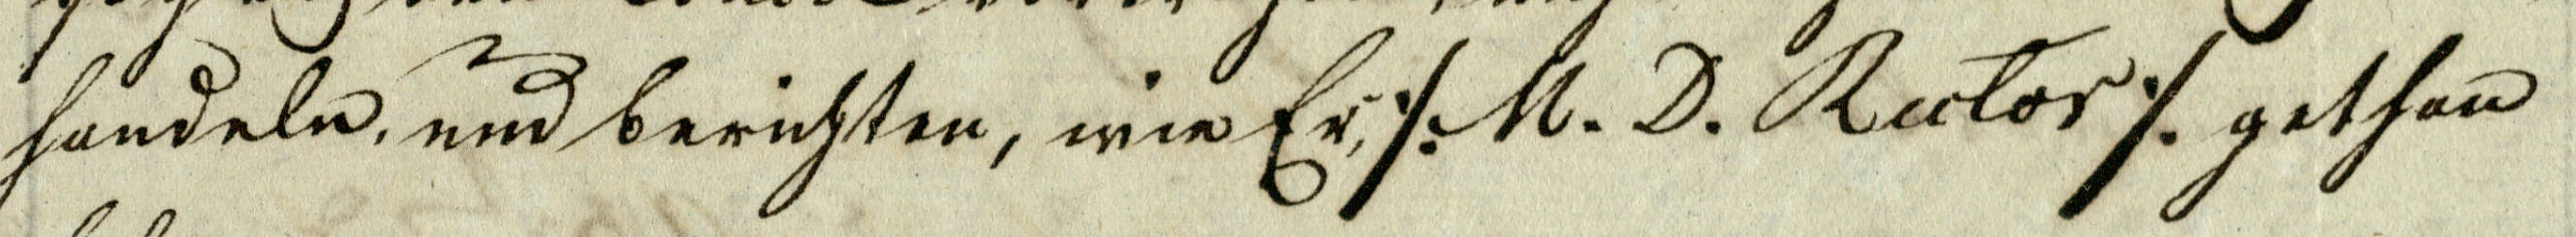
handeln, und berichten, wie Er /: M. D. Rector /. gethan
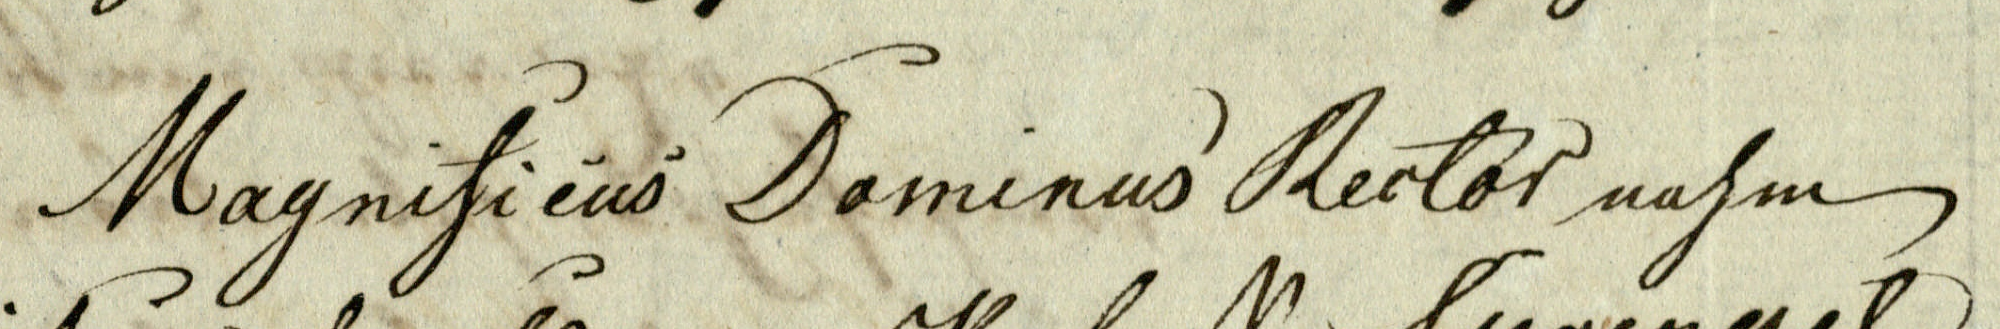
Magnificus Dominus Rector nahm
